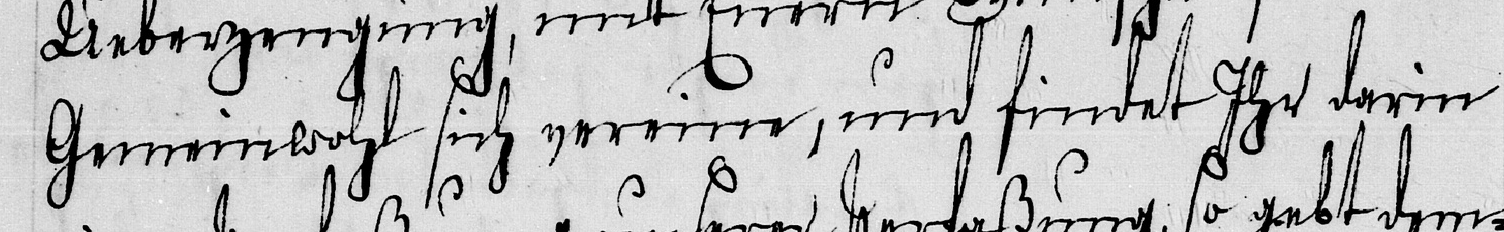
Gemeinwohl sich vereine, und findet Ihr darin
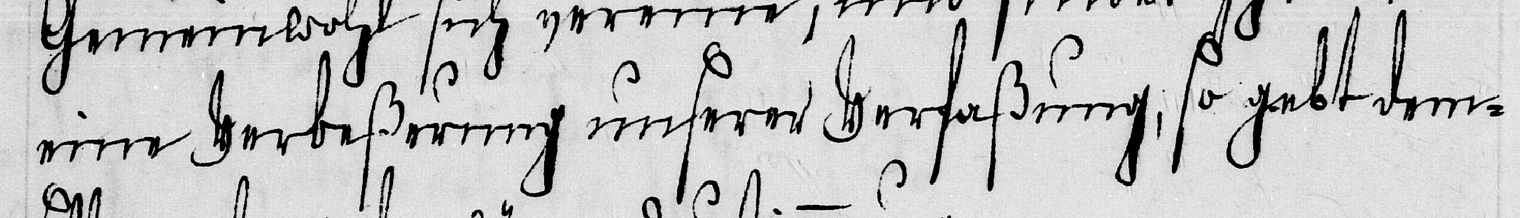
eine Verbeßerung unserer Verfaßung, so gebt dem¬
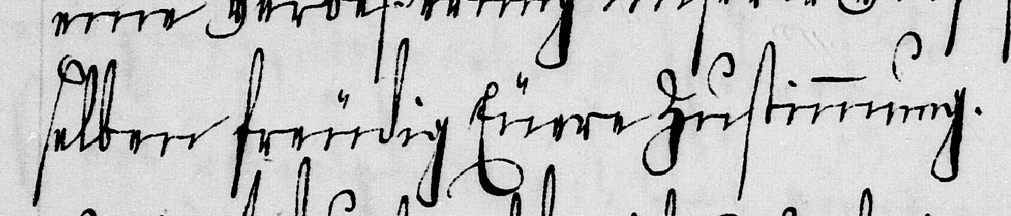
selben freudig Euere Zustimmung.
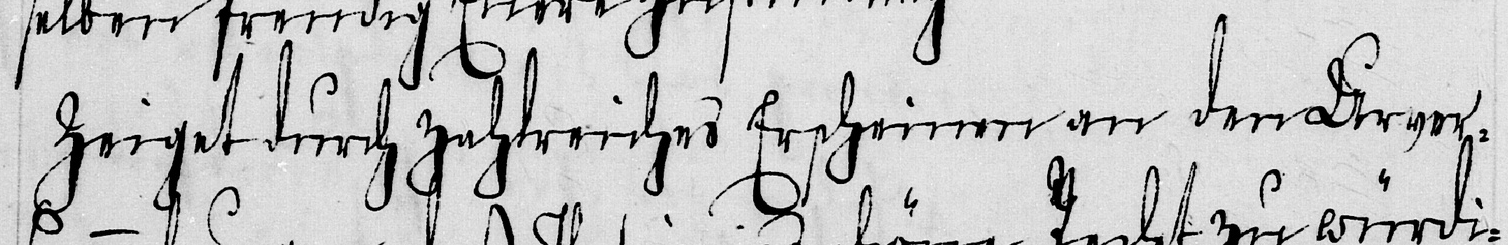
Zeiget durch zahlreiches Erscheinen an den Urver¬
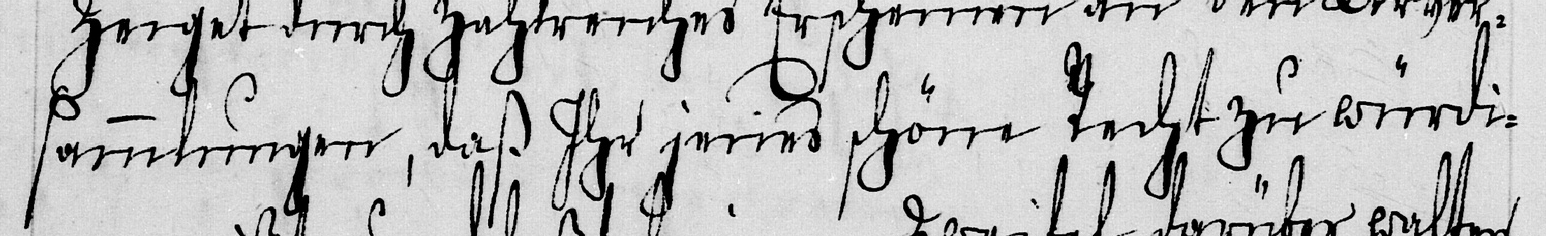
sammlungen, daß Ihr jenes schöne Recht zu würdi¬
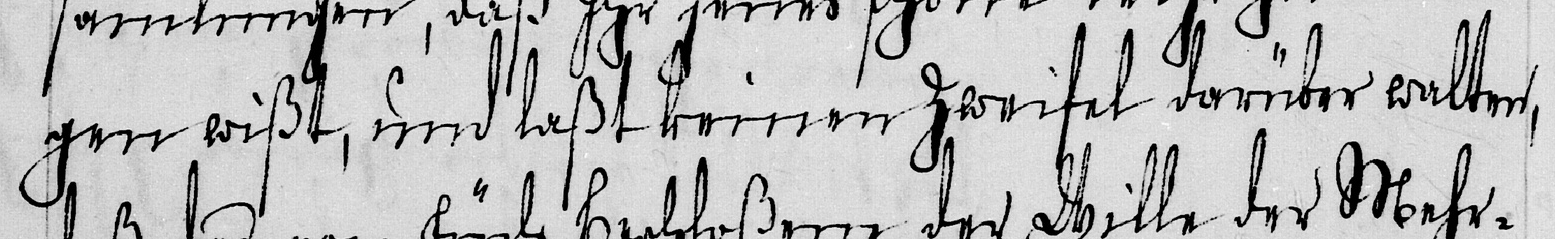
gen wißt, und laßt keinen Zweifel darüber walten,
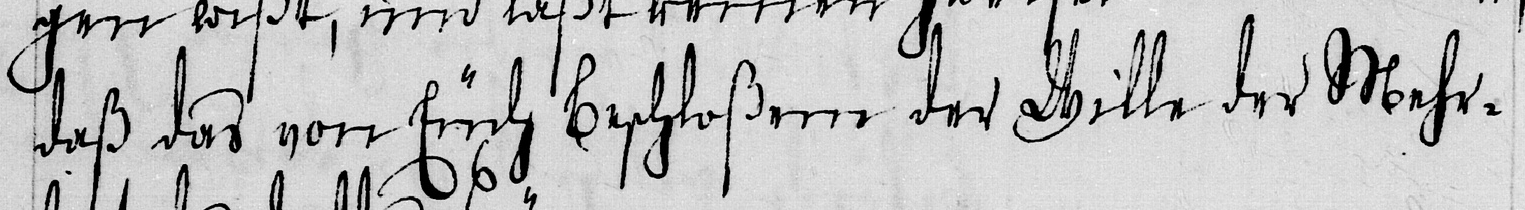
daß das von Euch beschloßene der Wille der Mehr¬
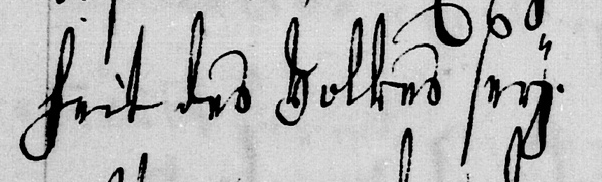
heit des Volkes sey.
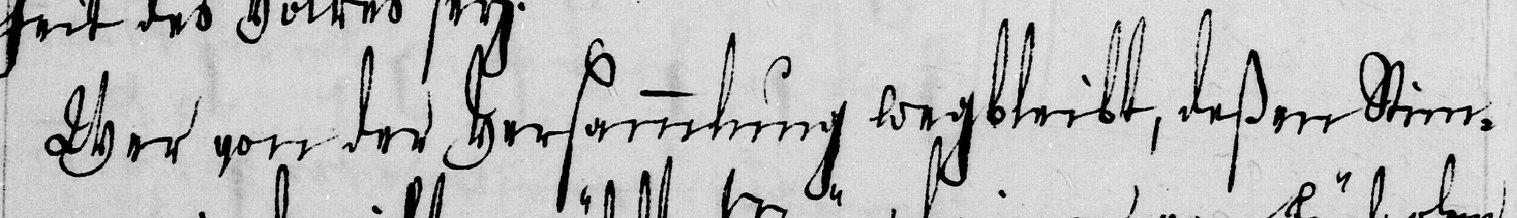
Wer von der Versammlung wegbleibt, deßen Stim¬
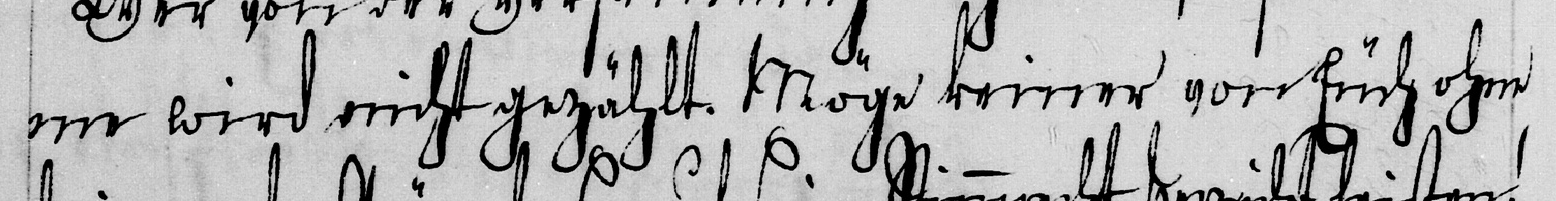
me wird nicht gezählt. Möge keiner von Euch ohne
